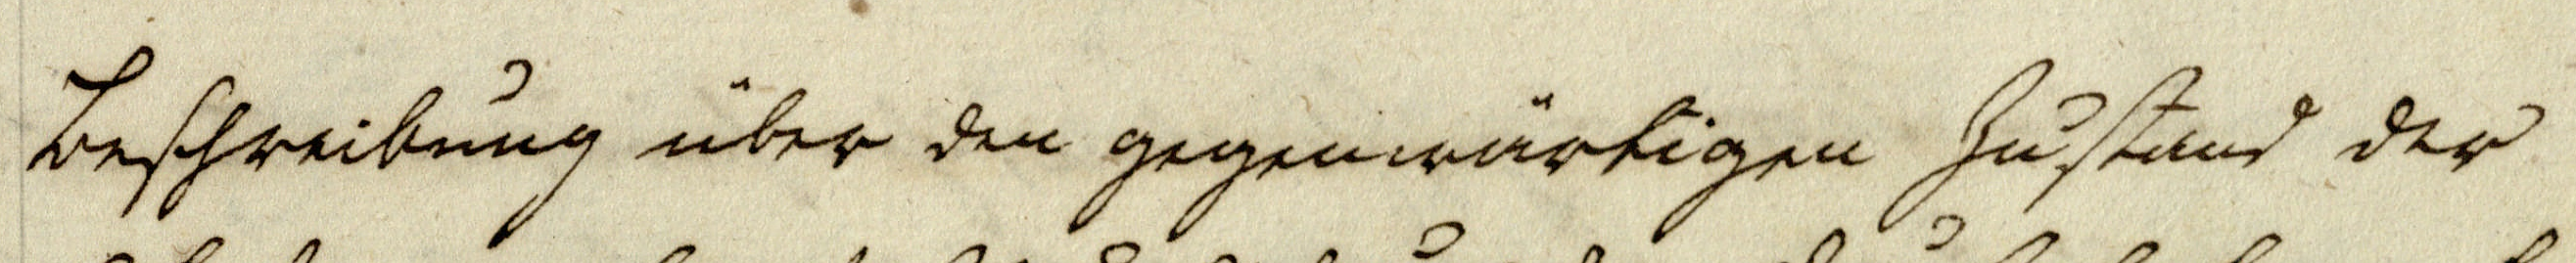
Beshreibung über den gegenwärtigen Zustand der
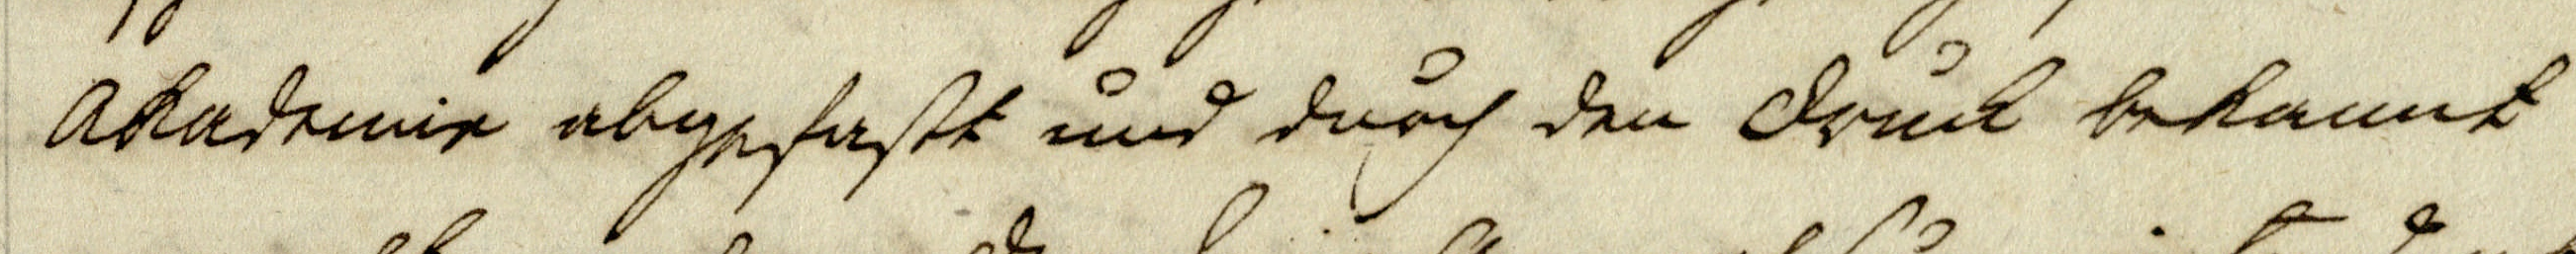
Akademie abgefaßt und durch den Druck bekannt
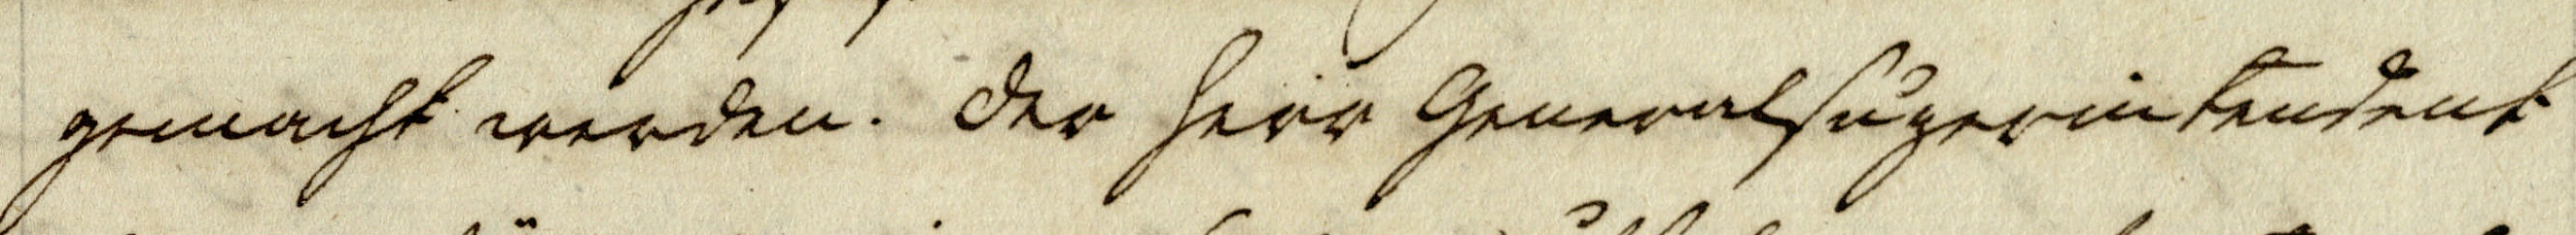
gemacht werden. Der Herr Generalsuperintendent
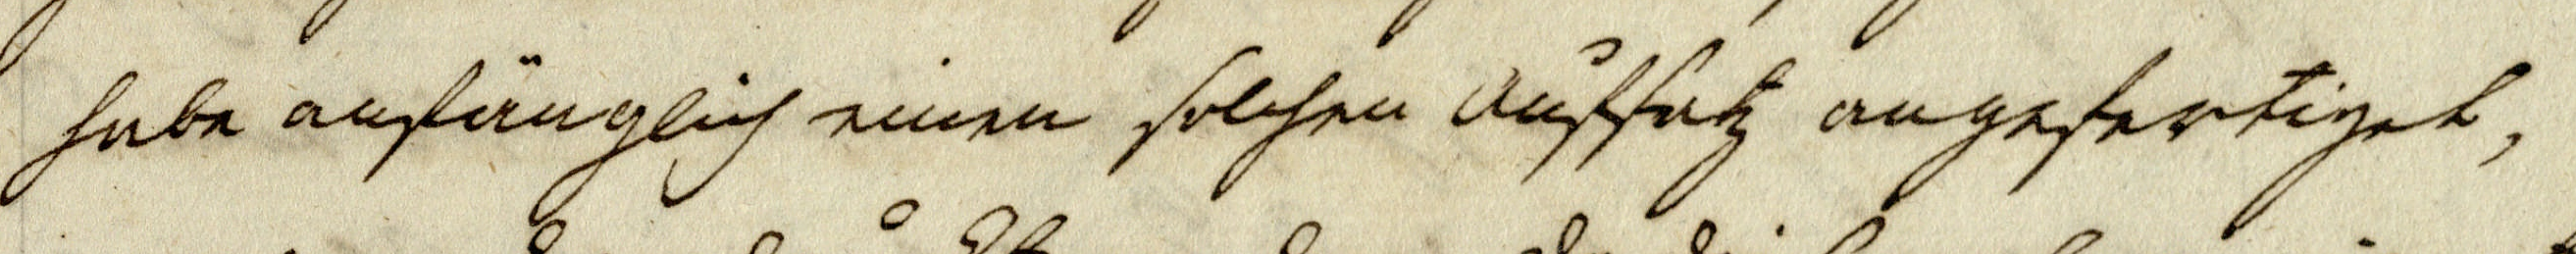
habe anfänglich einen solchen Aufsatz angefertiget,
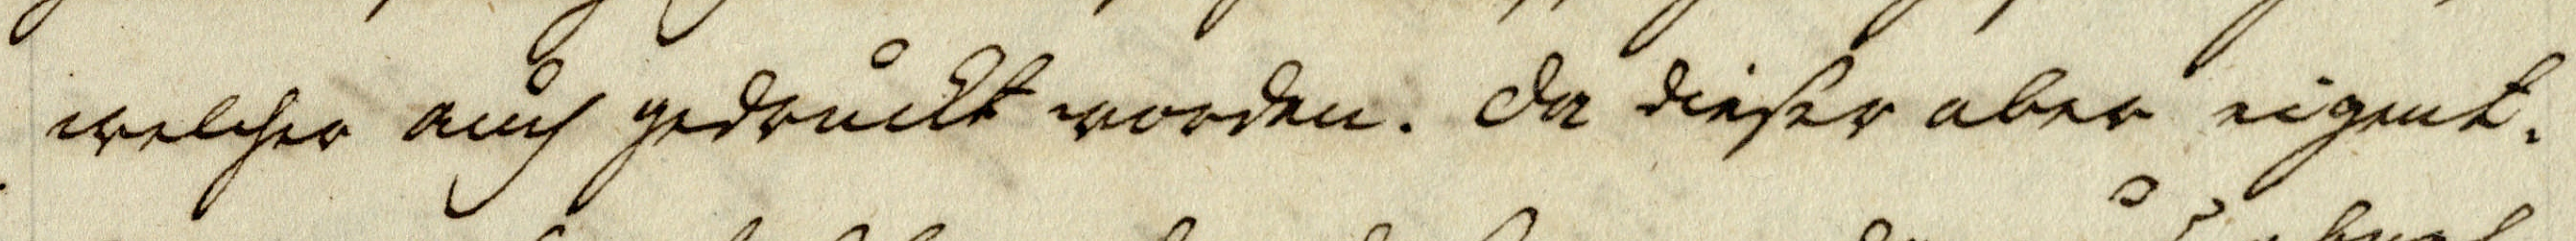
welcher auch gedruckt worden. Da dieser aber eigent¬
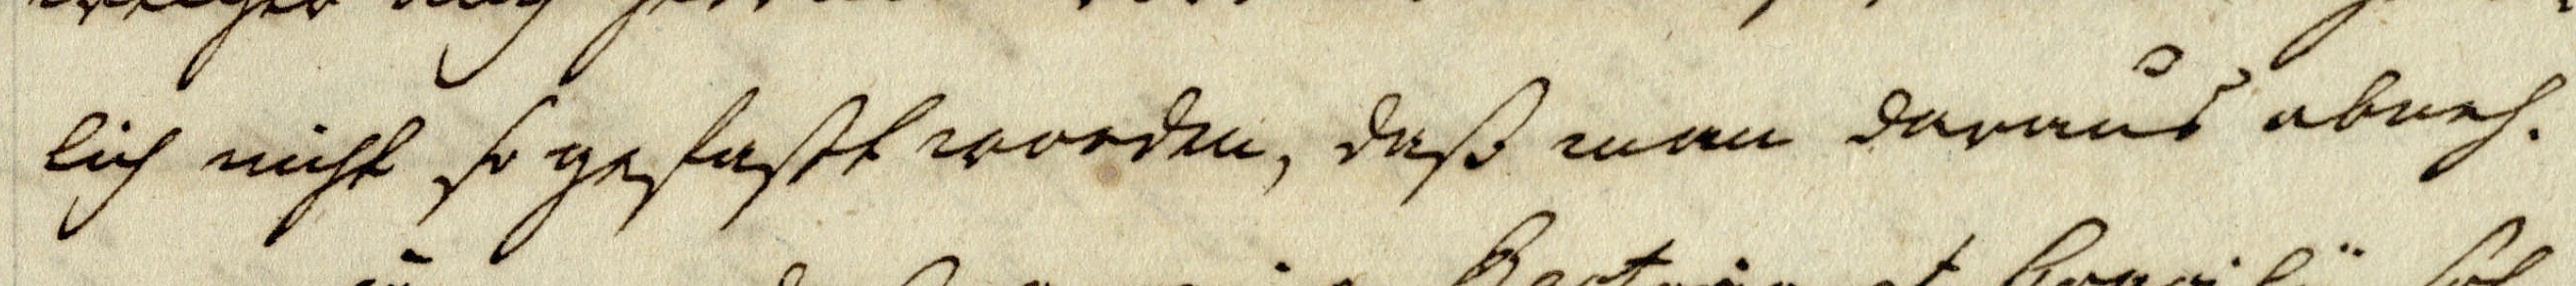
lich nicht so gefaßt worden, daß man daraus abneh¬
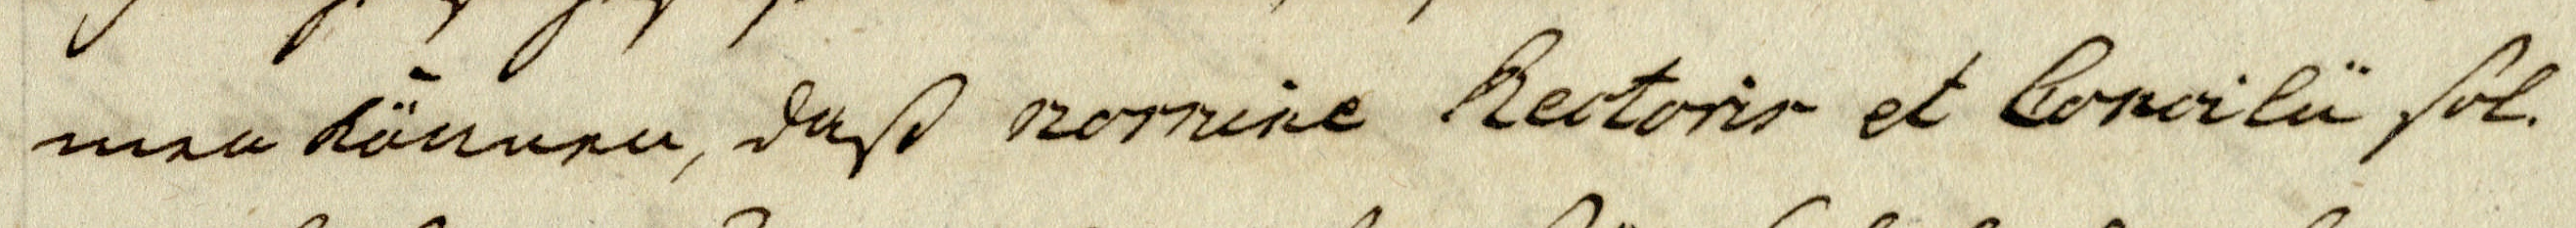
nen können, daß nomine Rectoris et Concilii sol¬
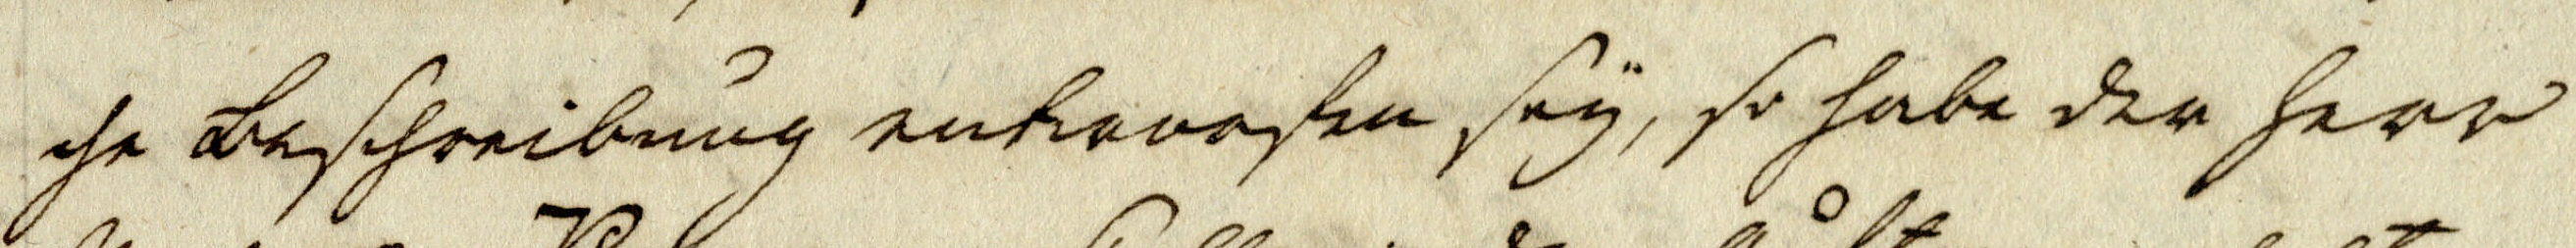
che Beschreibung entworfen seÿ, so habe der Herr
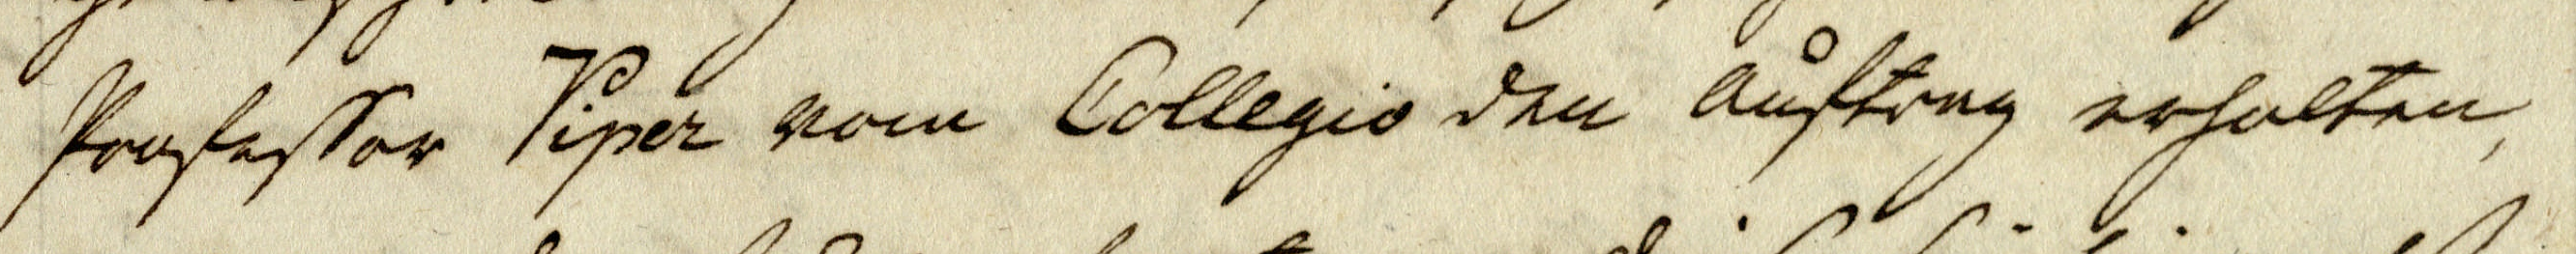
Professor Piper vom Collegio den Auftrag erhalten,
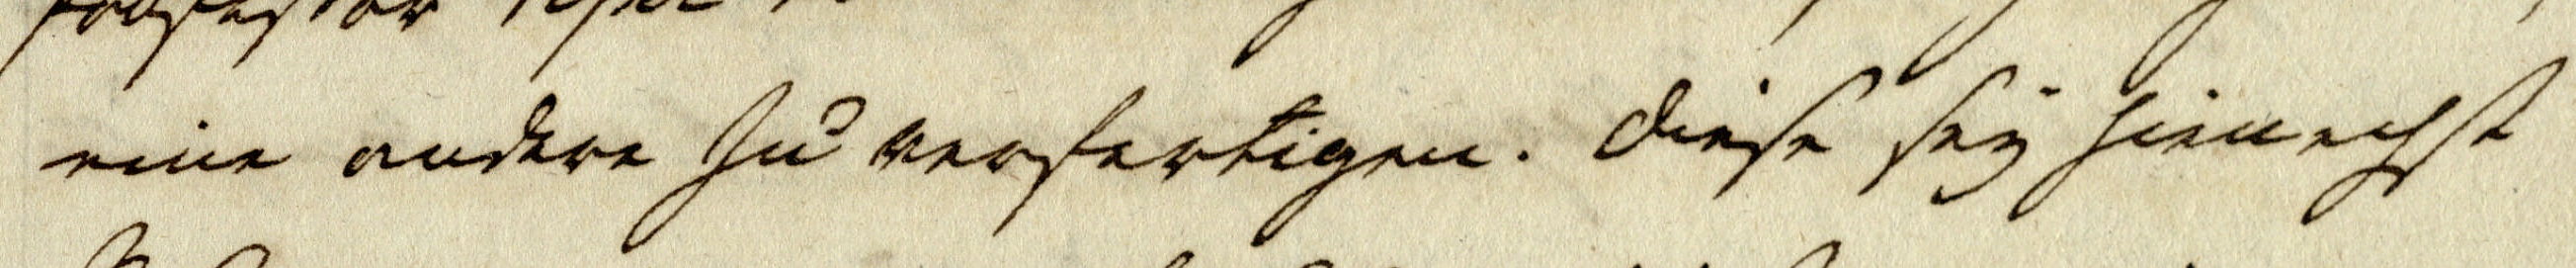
eine andere zu verfertigen. Diese seÿ hienechst
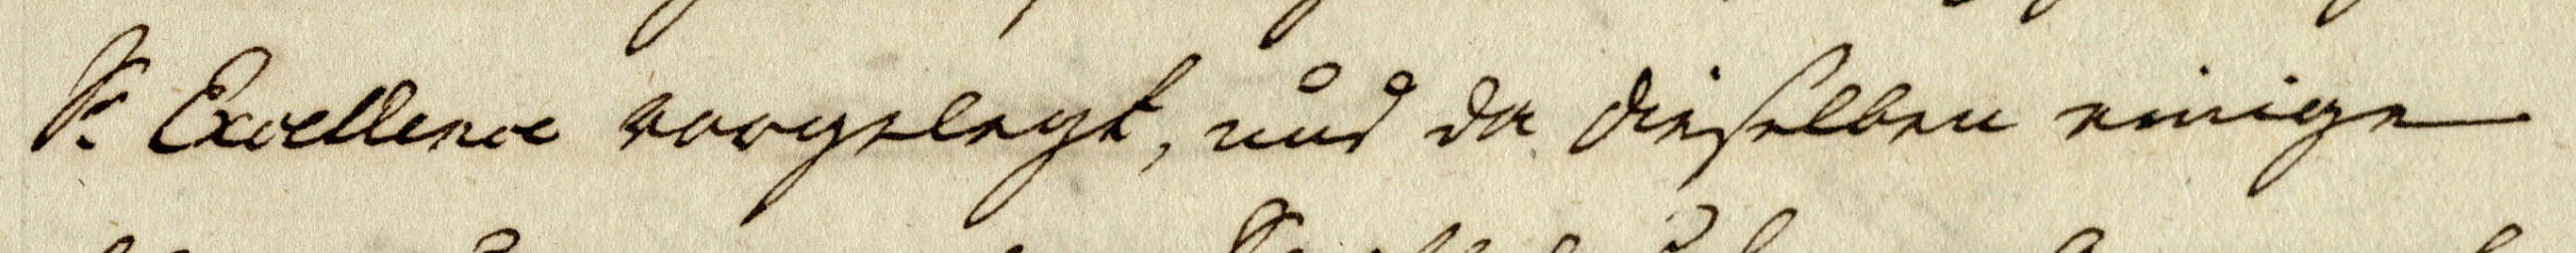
Sr Excellence vorgelegt, und da dieselben einige
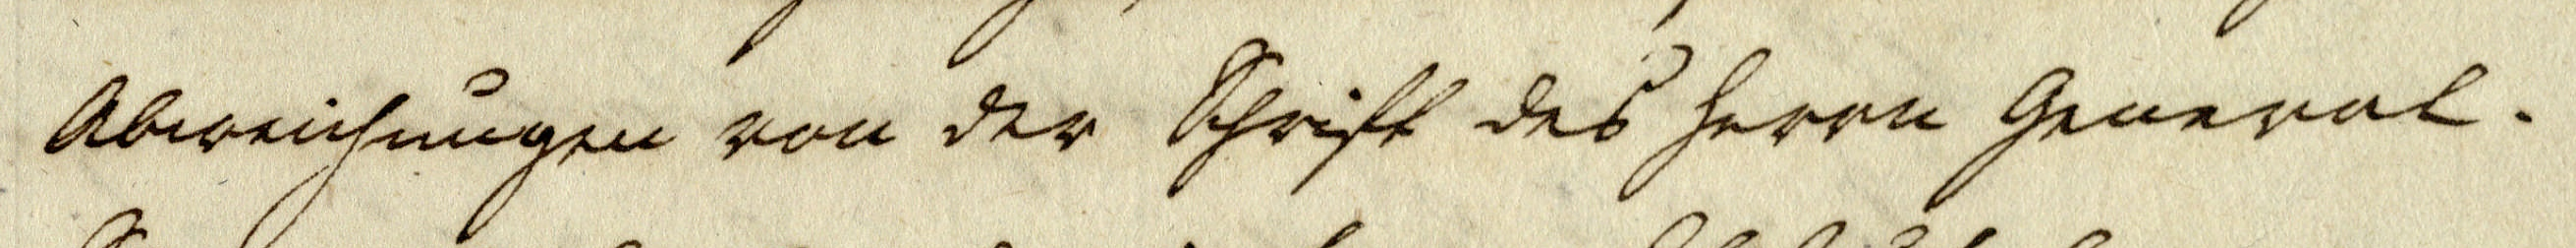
Abweichungen von der Schrift des Herrn General-
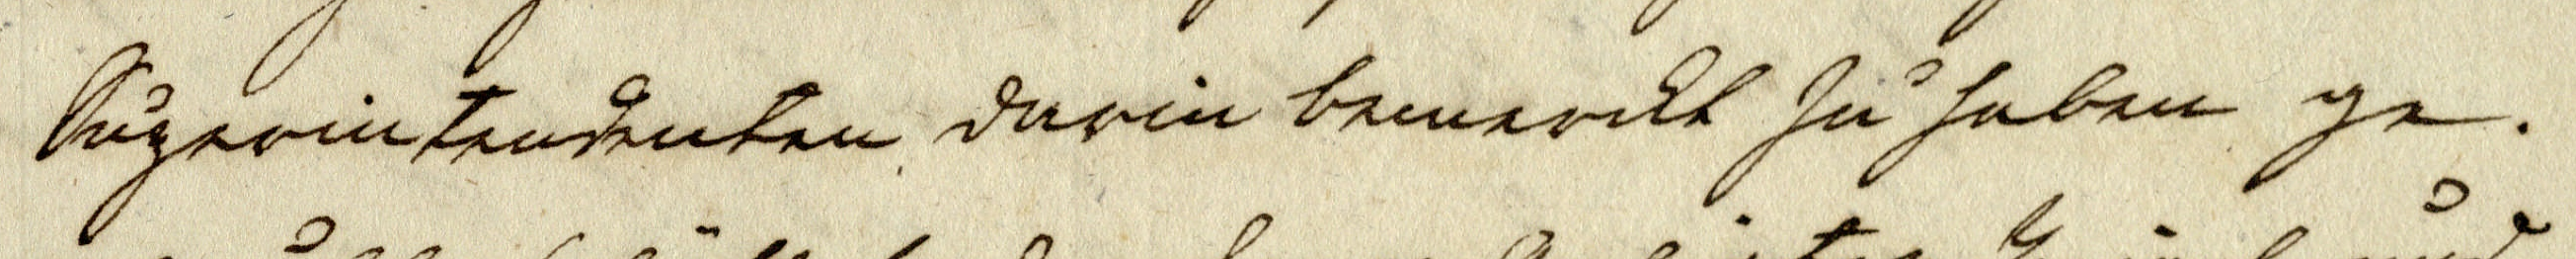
Superintendenten darin bemerckt zu haben ge¬
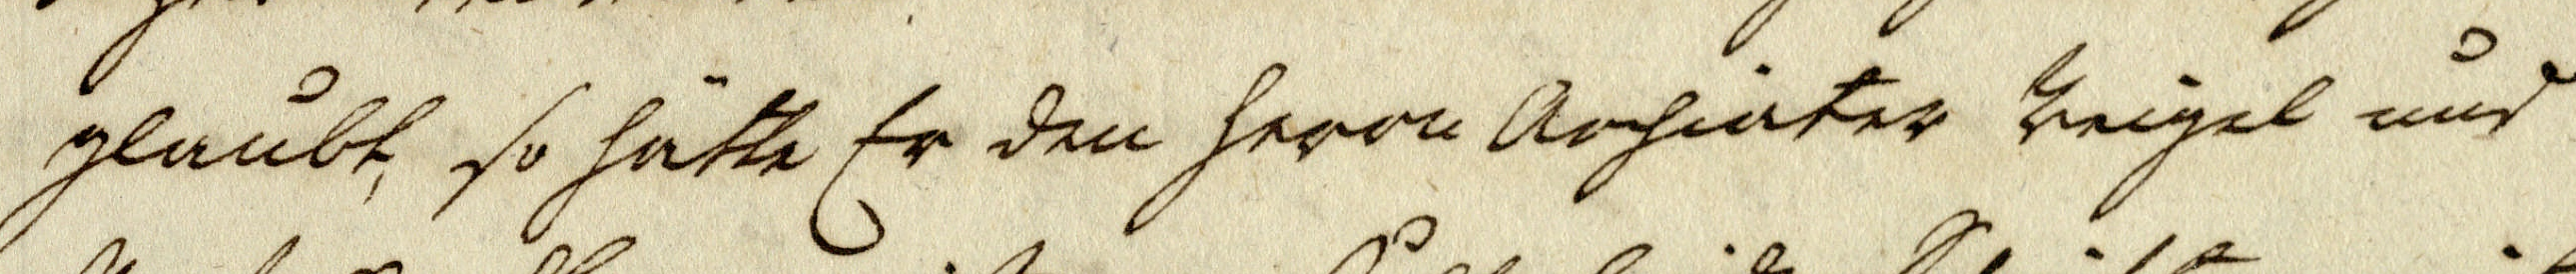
glaubt, so hätte Er den Herrn Archiater Weigel und
